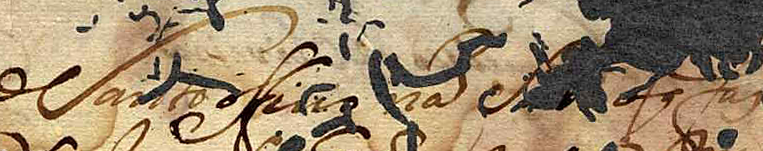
o Santo officio nā Sa o q̄ fas
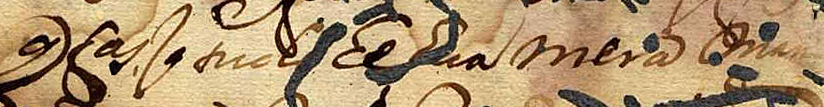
q̄ fas, q̄ tud he hua mera man
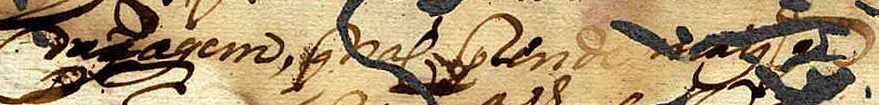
duzagem, q̄ naõ prende mais q̄
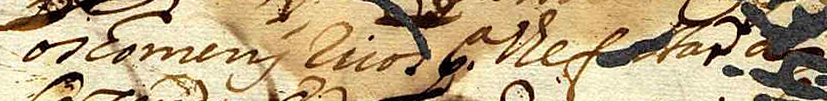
os homens Ricos p.a lhe f_rtar a
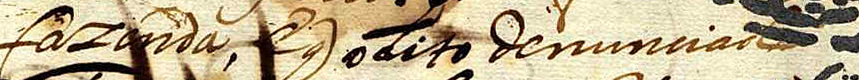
fazenda, E q̄ o dito denunciado
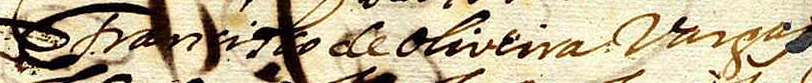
Francisco de oliveira Vargas
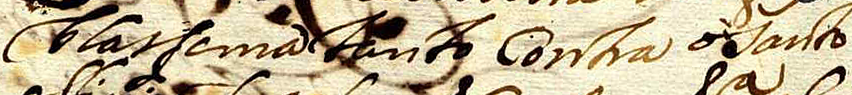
blasfema tanto contra o Santo
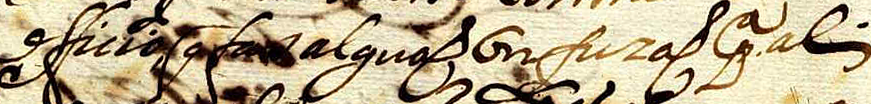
officio, q̄ faz alguā confuzaõ pa. al
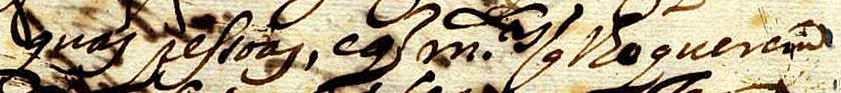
guas pessoas, e q̄ m.tas q̄ lho querem
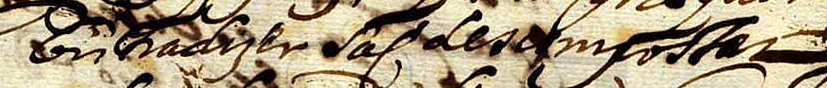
Contradizer saõ descompostas
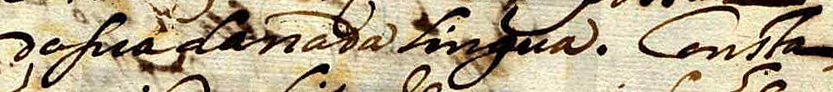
de sua danada lingua. Consta
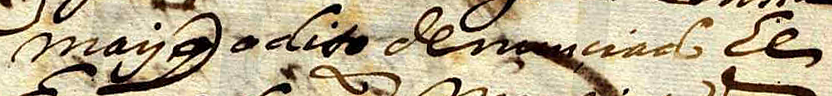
mais, q̄ o dito denunciado he
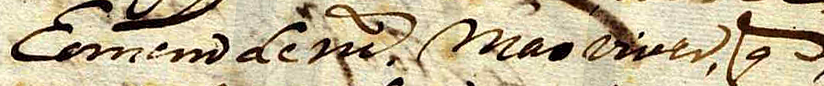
homem de mto. mao viver, q̄
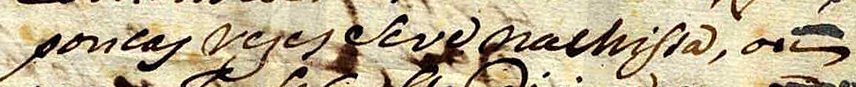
poucas vezes se ve na Missa, ou
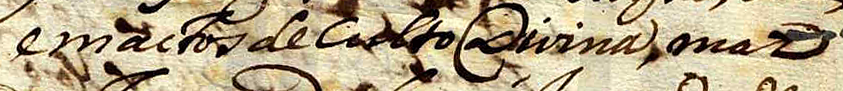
em actos de Culto Divina, mas
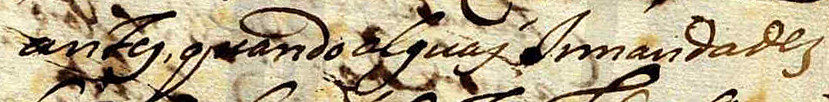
antes, quando alguās Irmandades
